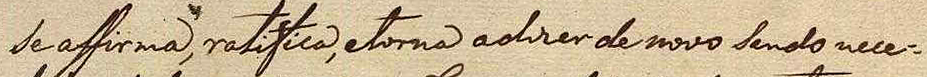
se affirma, ratifica, e torna a dizer de novo sendo nece
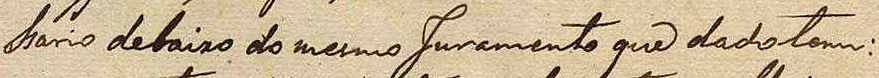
Ssario debaixo do mesmo Juramento que dado tem:
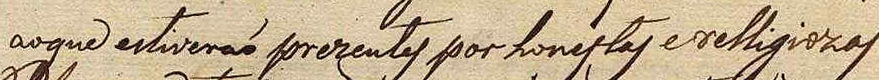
ao que estiveraõ prezentes por honestas, e relligiozas
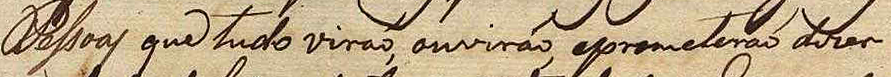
Pessoas que tudo virão, ouviraõ e prometeraõ dizer
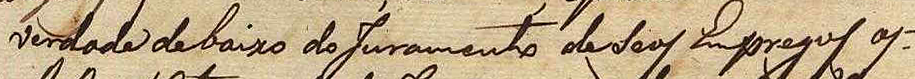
verdade debaixo do Juramento de seus Empregos os
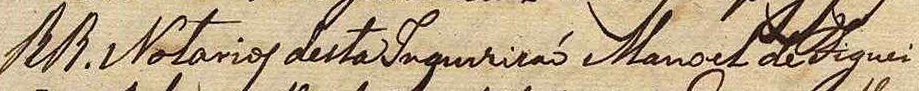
RR. Notarios desta Inquiziçaõ Manoel de Figuei
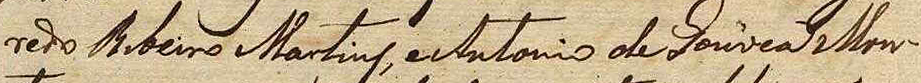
redo Ribeiro Martins, e Antonio de Gouvea Mon
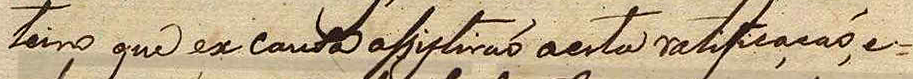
teiro que ex causa assistiraõ a esta ratificaçaõ, e
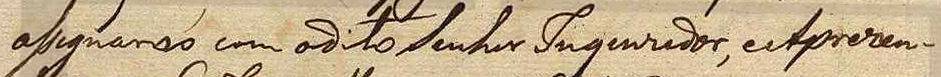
assignaraõ com o dito Senhor Inqeuzidor, e Aprezen
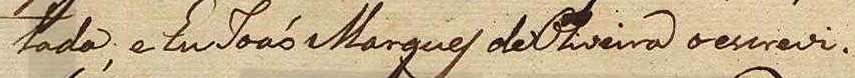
tada, e Eu Ioaõ Marques de Oliveira o escrevi.
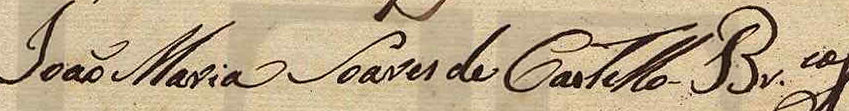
Ioaõ Maria Soares de Castello Br.co
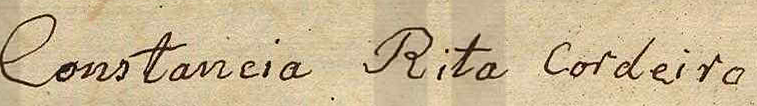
Constancia Rita Cordeiro
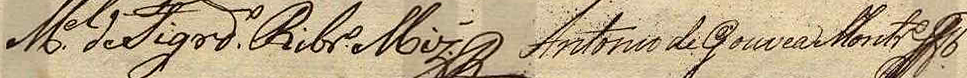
M.el de Figrd.o Ribr.o Miz̄ Antonio de Gouvea Montr.o
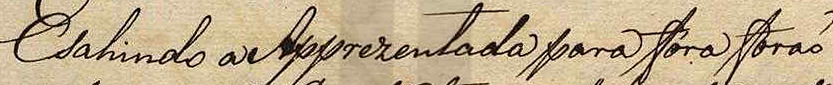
E sahindo a Apprezentada para fóra foraõ
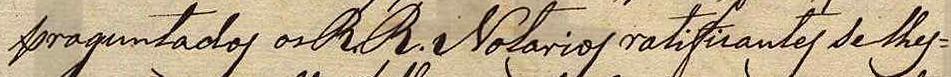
proguntados os R.R. Notarios ratificantes se lhes
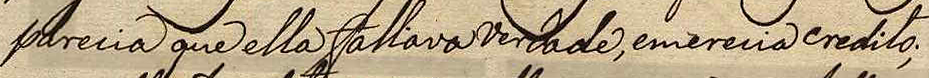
parecia que ella fallava verdade, e merecia credito;
